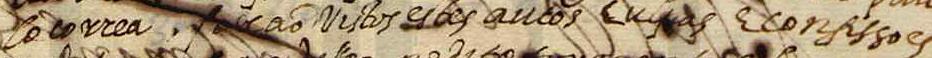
lo correa, foraõ vistos estes autos culpas E confissoẽs
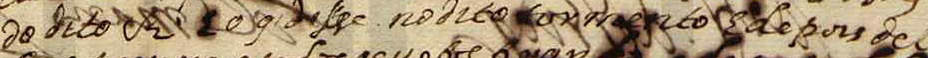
do dito R e o q̄ disse no dito tormento E depois del
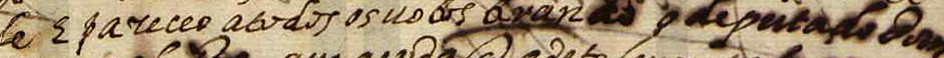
le E pareceo a todos os uotos tirando o deputado dom
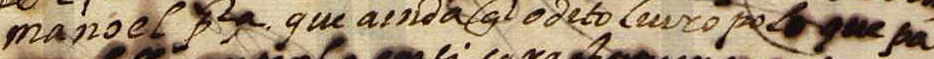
manoel pra que ainda q̄ o dito liuro polo que pa
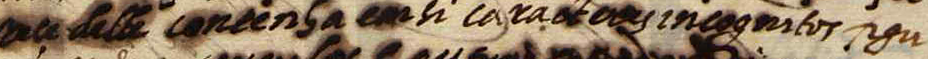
rece delle contenha em si caracteres incognitos figu
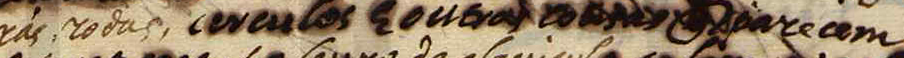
ras, rodas, cerculos E outras cousas q̄ parecem
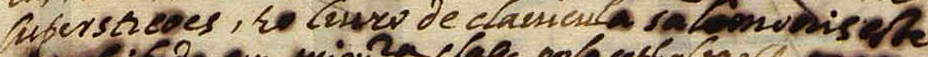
superstiçoes, E o liuro de clauicula salomonis este
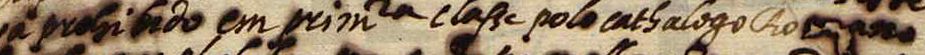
ja prohibido em primra classe pelo cathalogo Romano
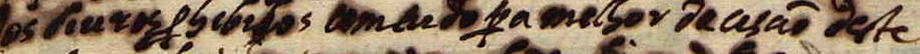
dos liuros ꝓhibidos comtudo ꝑa melhor decisaõ deste
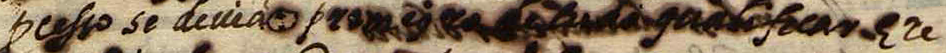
ꝓcesso se deuia primeiro de tudo qualificar E re
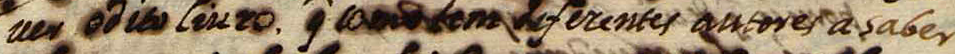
uer o dito liuro, q̄ como tem diferentes autores a saber
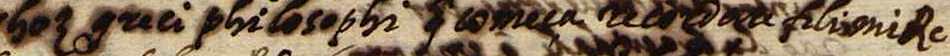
Thoz greci philosophi q̄ começa recordare fili mi Re
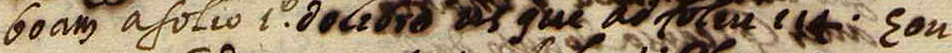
boam a folio 1.o do liuro usque ad foliū 114. E ou
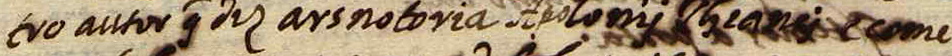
tro autor q̄ diz ars notoria Apolonij Thianei e come
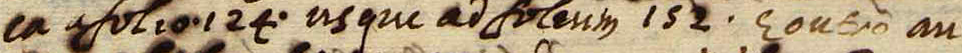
ça a folio .124. usque ad folium 152. E outro au
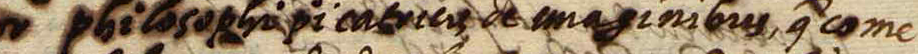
tor philosophi picatricis de imaginibus, q̄ come
